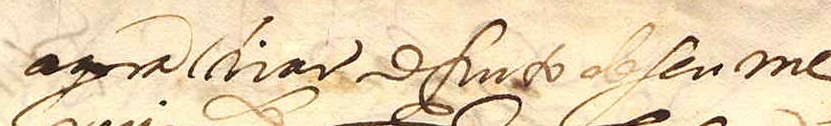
agora tirar o fruto de seu me
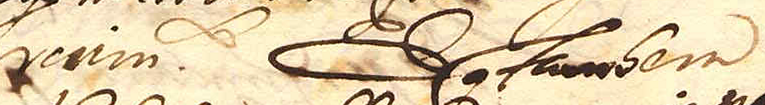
recim.to E q̄ tambem
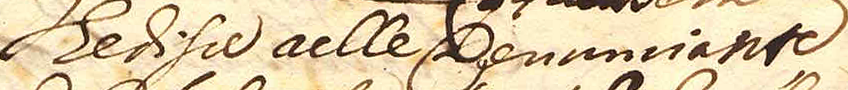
lhe disse a elle Denunciante
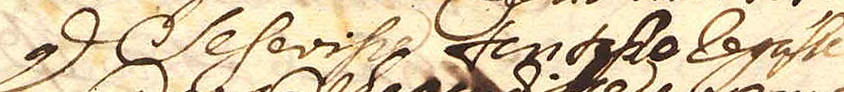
q̄ Se se visse tentado Rogasse
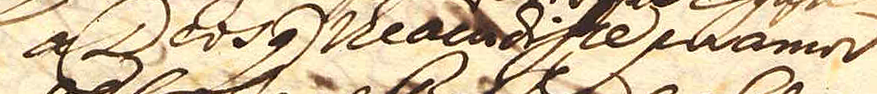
a Deos q̄ lhe acudisse por amor
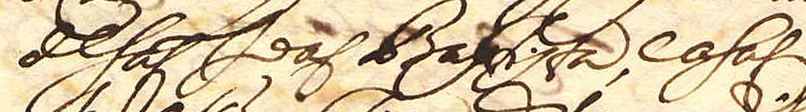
de Saõ Joaõ Baptista, e a Saõ
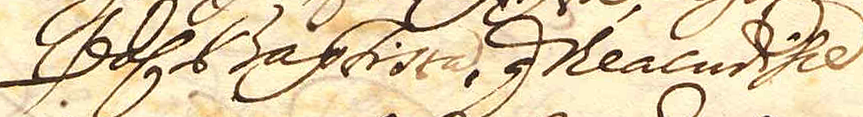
Joaõ Baptista, q̄ lhe acudisse
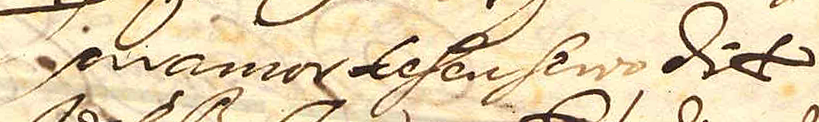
por amor de seu servo dito
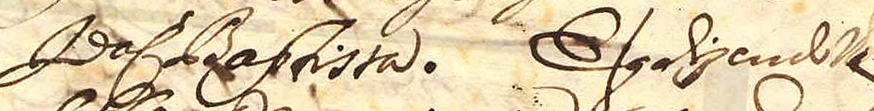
Joaõ Baptista. E q̄ dizendolhe
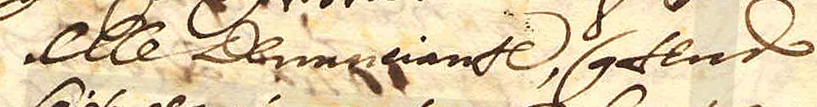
elle Denunciante, q̄ tendo
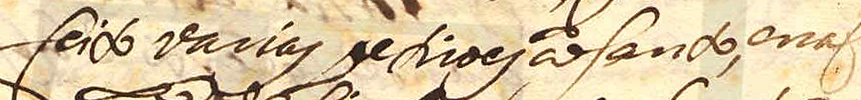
feito varias petiçoes ao santo, e naõ
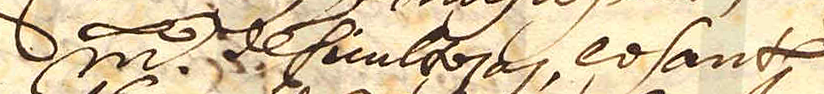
m.to deficultosas, e o santo
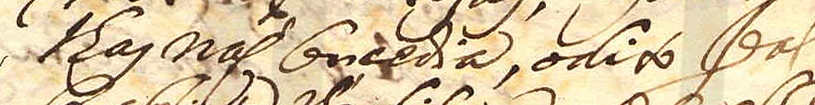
lhas naõ Concedia, o dito Joaõ
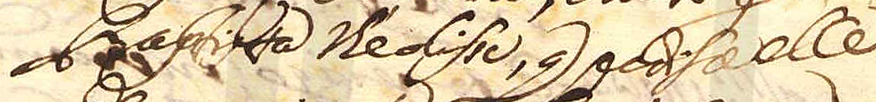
Baptista lhe disse, q̄ pedise elle
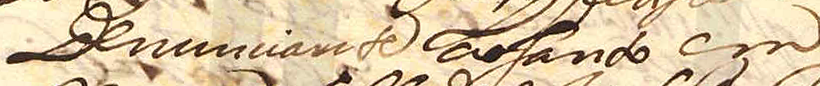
Denunciante ao Santo em
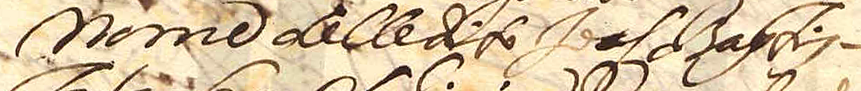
nome delle dito Joaõ Baptis
